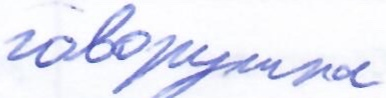говорушка
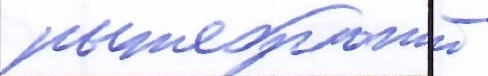рыжебрюхий
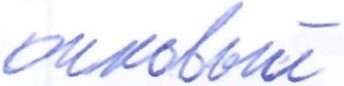очковый
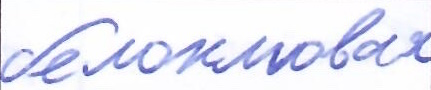белоклювая
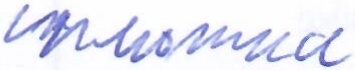сплюшка
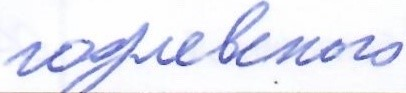годлевского
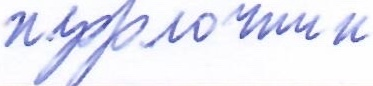худолочник
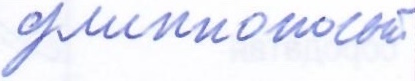длинноносый
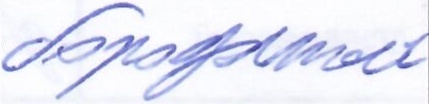бородатая
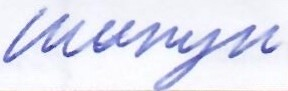шипун
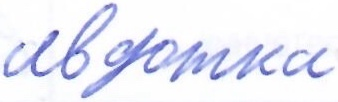авдотка
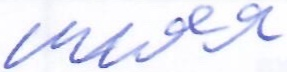синяя
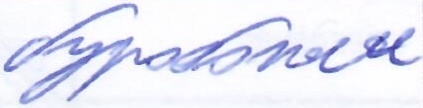буроботи
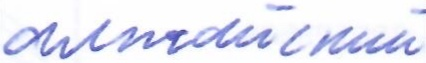алтайский
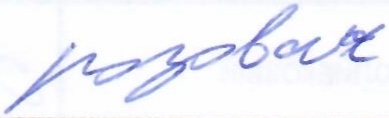розовая
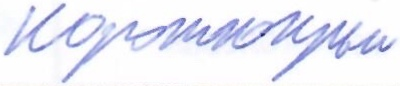короткокрыл
